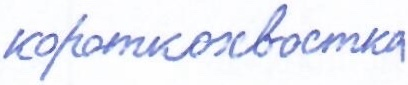короткохвостка
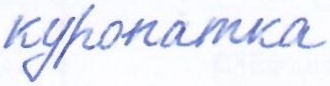куропатка
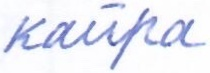кайра
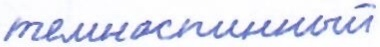темноспинный
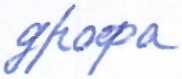дрофа
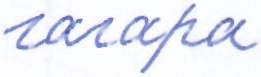гагара
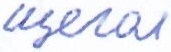щегол
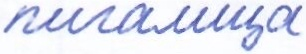пигалица
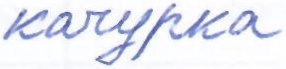качурка
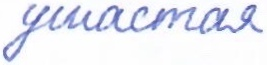ушастая
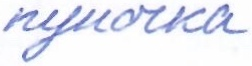пуночка
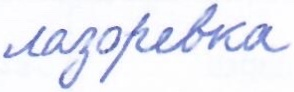лазоревка
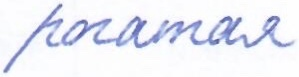рогатая
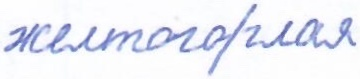желтогорлая
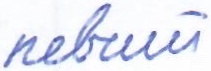певчий
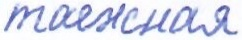таежная
